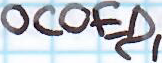осоед
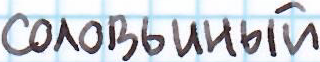соловьиный
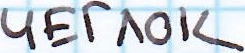чеглок
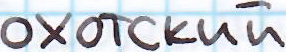охотский
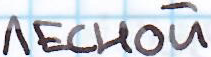лесной
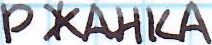ржанка
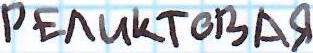реликтовая
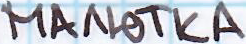малютка
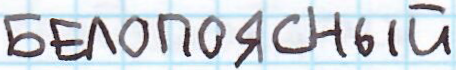белопоясный
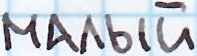малый
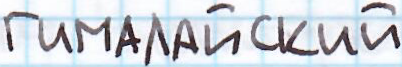гималайский
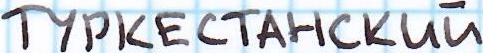туркестанский
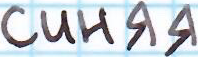синяя
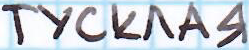тусклая
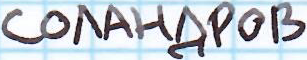соландров
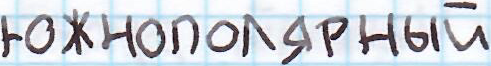южнополярный
